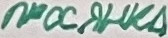просянка
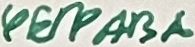чеграва
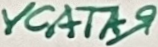усатая
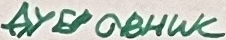дубровник
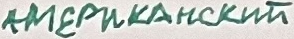американский
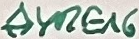дупель
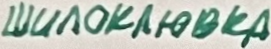шилоклювка
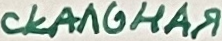скальная
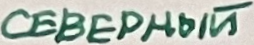северный
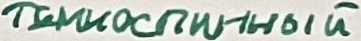темноспинный
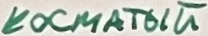косматый
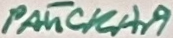райская
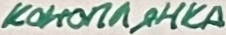коноплянка
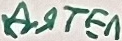дятел
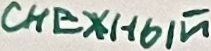снежный
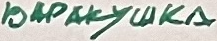варакушка
